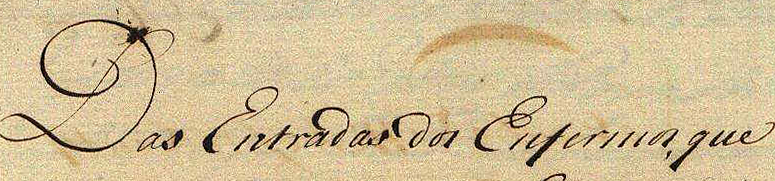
Das Entradas dos Enfermos, que
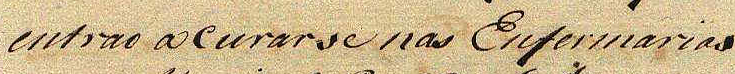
entrao a curarse nas Enfermarias
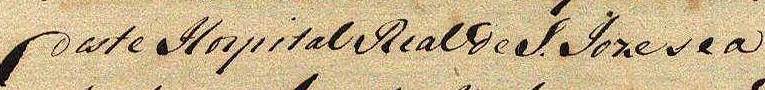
deste Hospital Real de S. Ioze se a
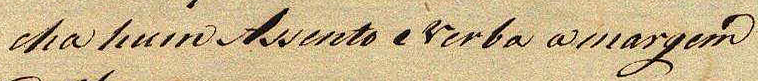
cha hum Assento e verba a margem
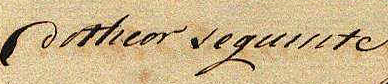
do theor seguinte
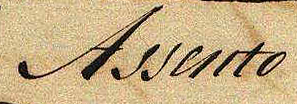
Assento
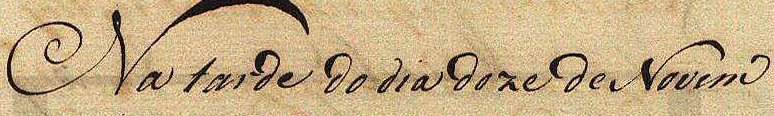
Na tarde do dia doze de Novem
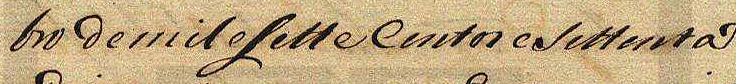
bro de mil e settecentos e settenta
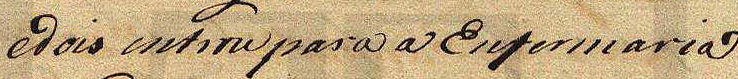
e dois entrou para a Enfermaria
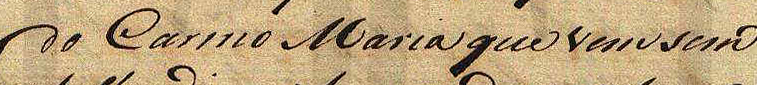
do Carmo Maria que vem sem
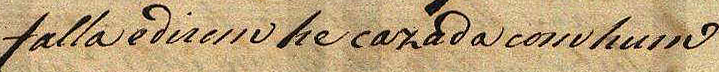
falla e dizem he cazada com hum
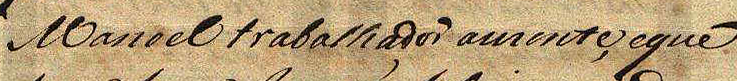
Manoel trabalhador auzente, e que
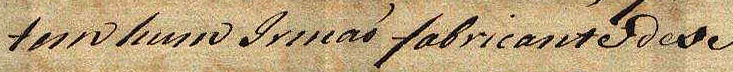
tem hum Irmaõ fabricante de se
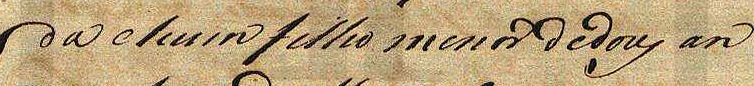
da e hum filho menor de dous an
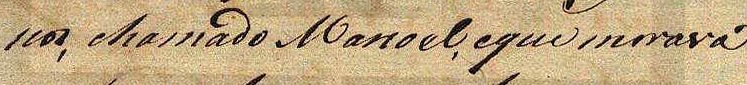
nos, chamado Manoel, e que morava
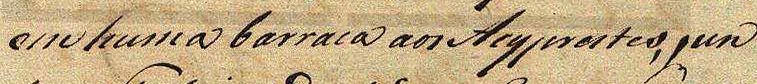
em huma barraca aos Acyprestes, jun
